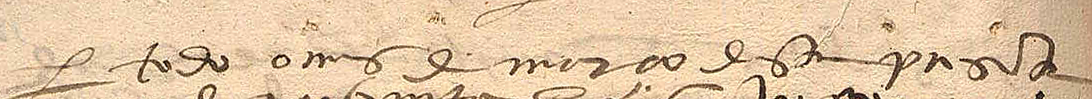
ꝑ todo o mes de março deste presēte
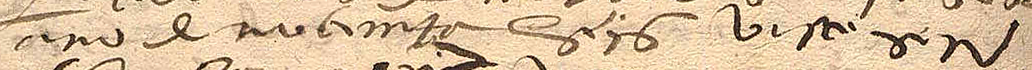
ano de novemta e seis visto serē
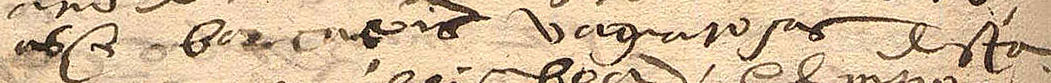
as ēbarcaçoĩs vaguarosas desta
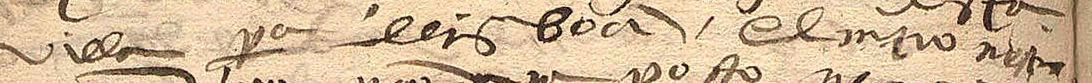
villa ꝑa llisboa / e demtro neste
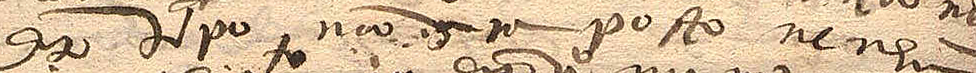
dito tēpo não sera posto nenhū
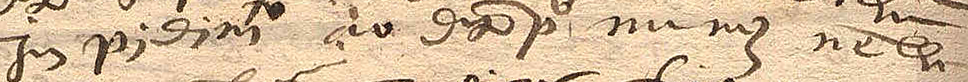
Jmpidimto ao dit̄o po nunez nē lhe
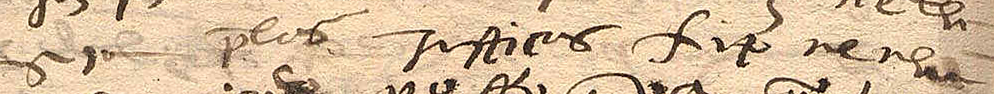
sera p̄las Justiças feito nenhū
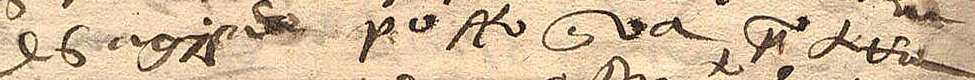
desagujsado posto q̄ va p̄o teRa
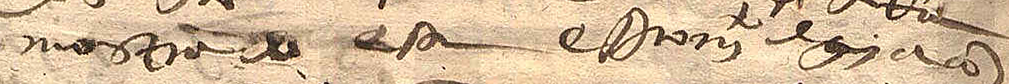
mostrādo este estromto de guja cō
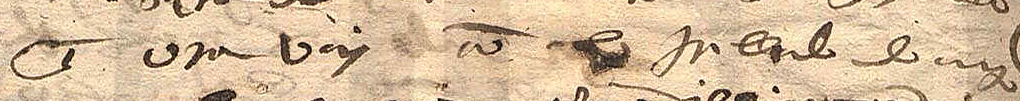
q̄ ora vaj c̄o ho trellado do auto
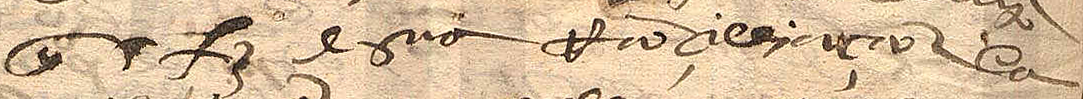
q̄ se fez de sua Rec̄ocilliaçaõ e a
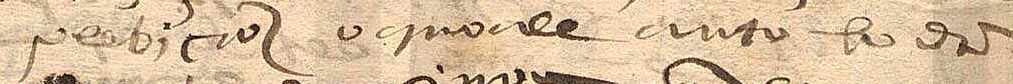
sollviçaõ o quoall auto ho dtō
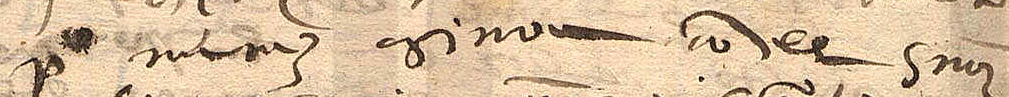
po nunez asinou c̄o elle Snor̄
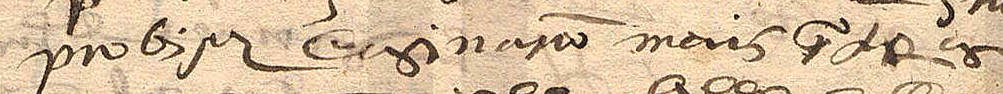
provisor e asinarō mais p̄o testas
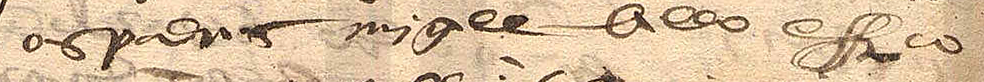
os padres migell bello e ffrco
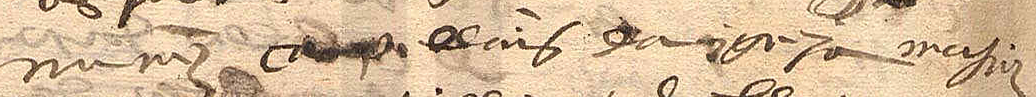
nunēz capellaĩs da igreJa matriz
